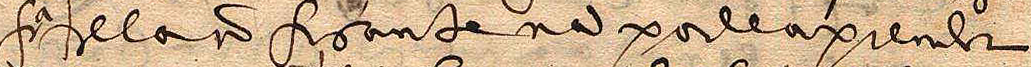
ella cōfesante nā pode aprender
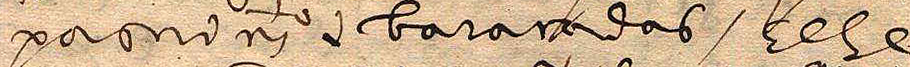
por serē mto ēbaraçadas / E lhe
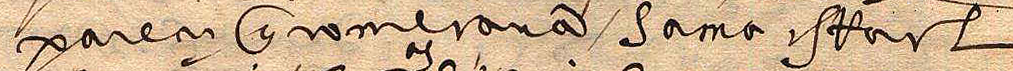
pareçe q̄ começauão / Sama isRaeL
